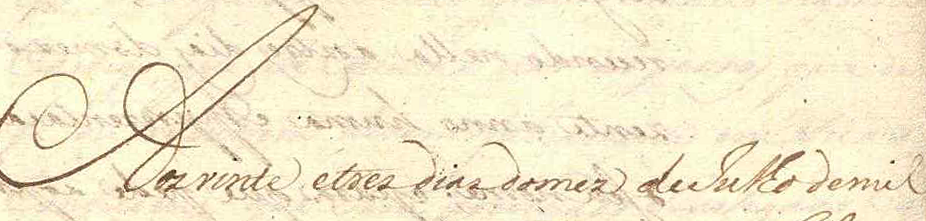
Aos vinte e tres dias do mes de Iulho de mil
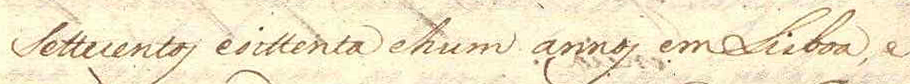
Settecentos e oittenta e hum annos em Lisboa, e
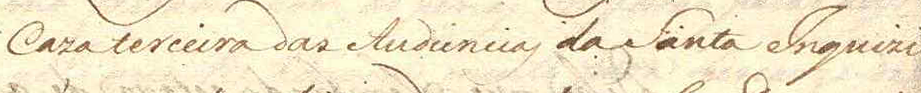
Caza terceira das Audiencias da Santa Inquizi
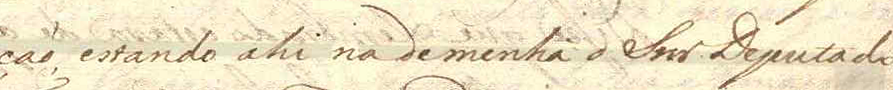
çaõ, estando ahi na de menhã o Snr Deputado
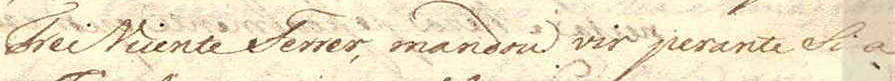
Frei Vicente Ferrer, mandou vir perante Si a
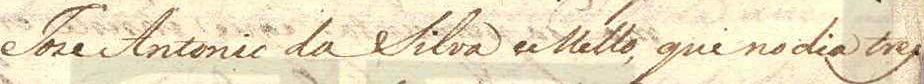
Ioze Antonio da Silva e Mello, que no dia tres
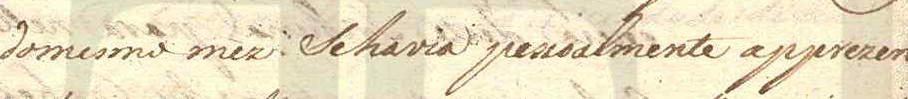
do mesmo mez Se havia pessoalmente apprezen
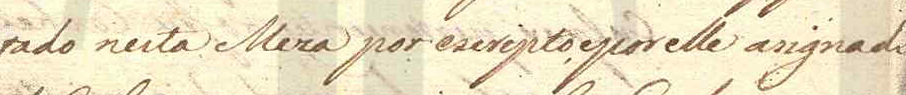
tado nesta Meza por escripto, e por elle asignado
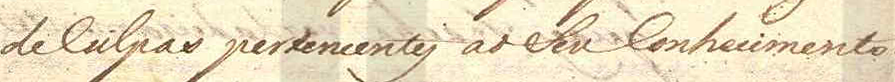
de Culpas pertencentes ao Seu Conhecimento
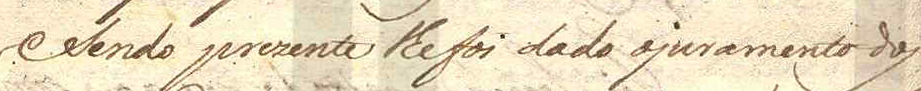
e Sendo prezente lhe foi dado o juramento dos
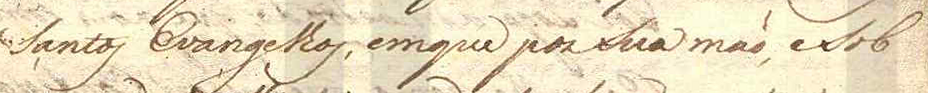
Santos Evangelhos, em que poz Sua maõ, e Sob
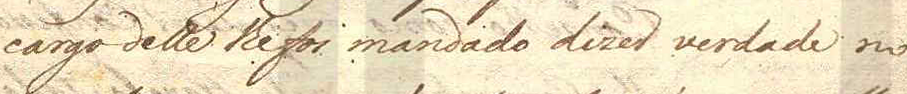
cargo delle lhe foi mandado dizer verdade no
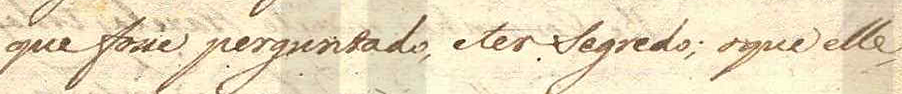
que fosse perguntado, e ter Segredo; o que elle
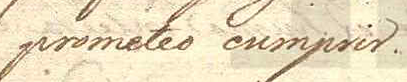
prometeo cumprir.
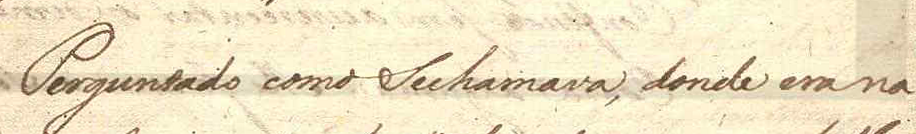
Perguntado como Se chamava, donde era na
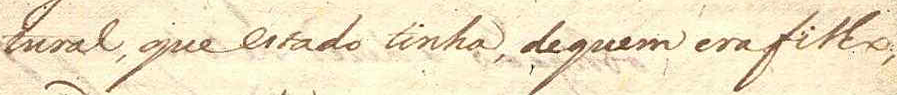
tural, que estado tinha, de quem era filho,
